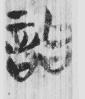訽
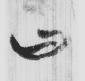曰
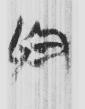於
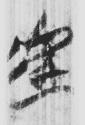𫊟
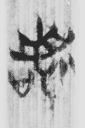若
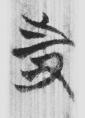寺
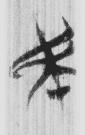民
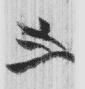之
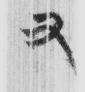又
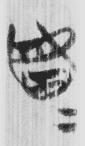母田=
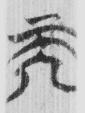而
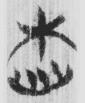本B（本）
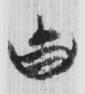由
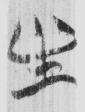生
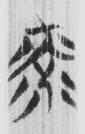光
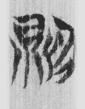則
